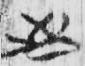至
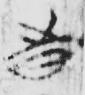○（時）
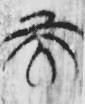而
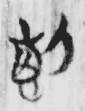○（斷）
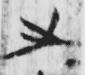之
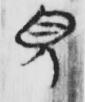視
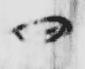日
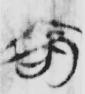命
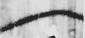一
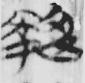執
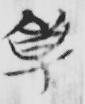事
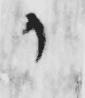人
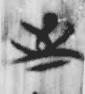至（致）
